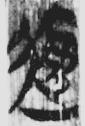逾
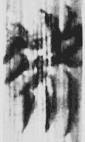{虍介}（乎）
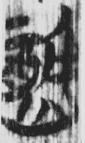○（沈）
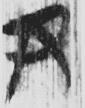尹
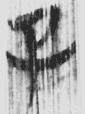子
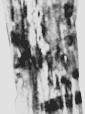桱
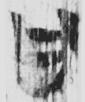曰
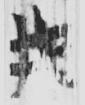四
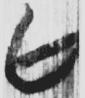㠯（以）
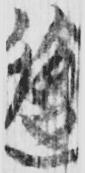逾
